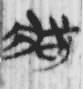戕
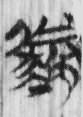○（拳）
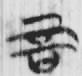言
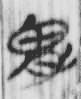{胃刀}（謂）
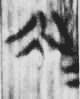小人
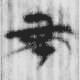不
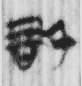○（信）
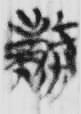○（竊）
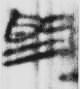馬
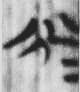小人
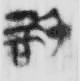○（信）
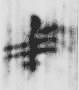与（與）
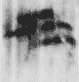下
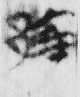○（蔡）
